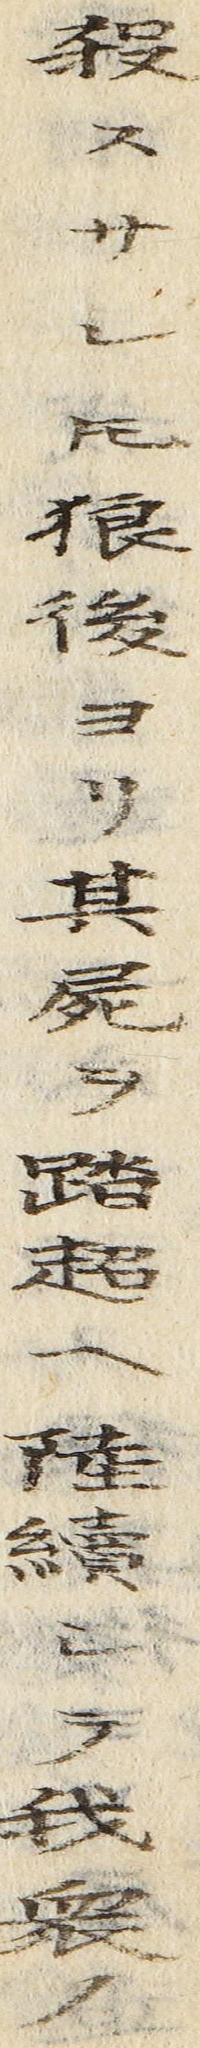殺スサレトモ狼後ヨリ其屍ヲ踏越ヘ陸続シテ我衆ノ
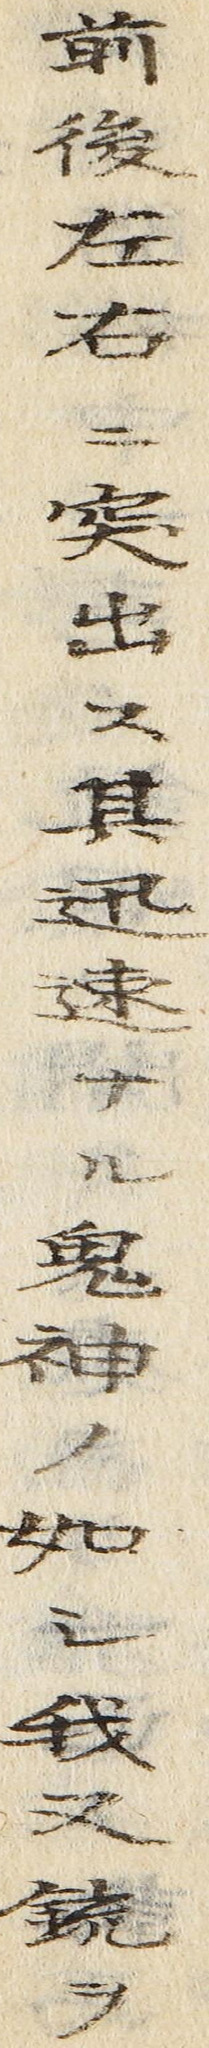前後左右ニ突出ス其迅速ナル鬼神ノ如シ我又銃ヲ
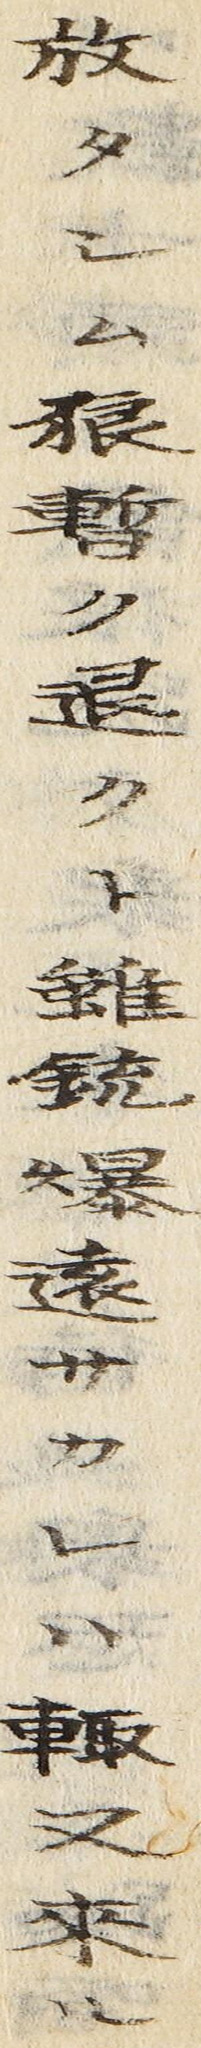放タシム狼暫ク退クト雖銃爆遠サカレハ輙又来ル
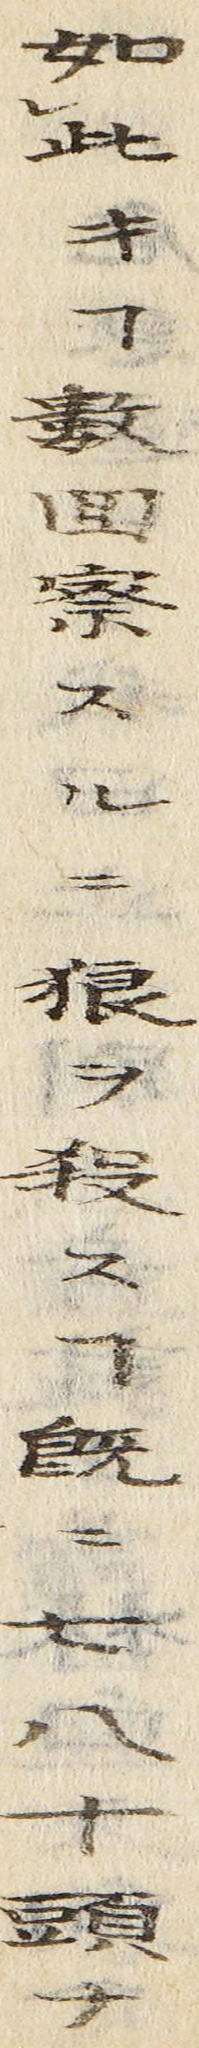如此キコト数回察スルニ狼ヲ殺スコト既ニ七八十頭ナ
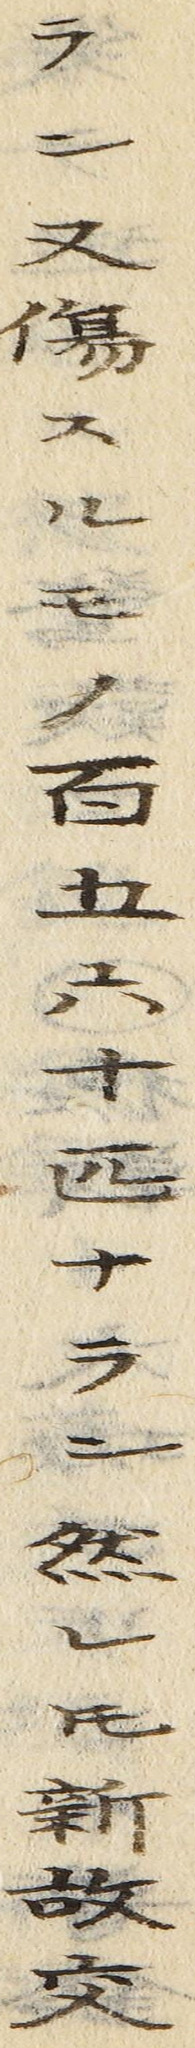ラン又傷スルモノ百五六十匹ナラン然レトモ新故交
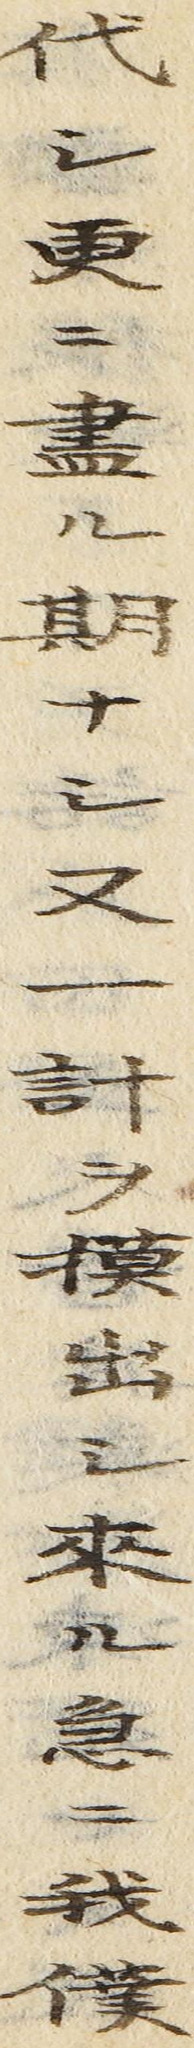代シ更ニ尽ル期ナシ又一計ヲ摸出シ来ル急ニ我僕
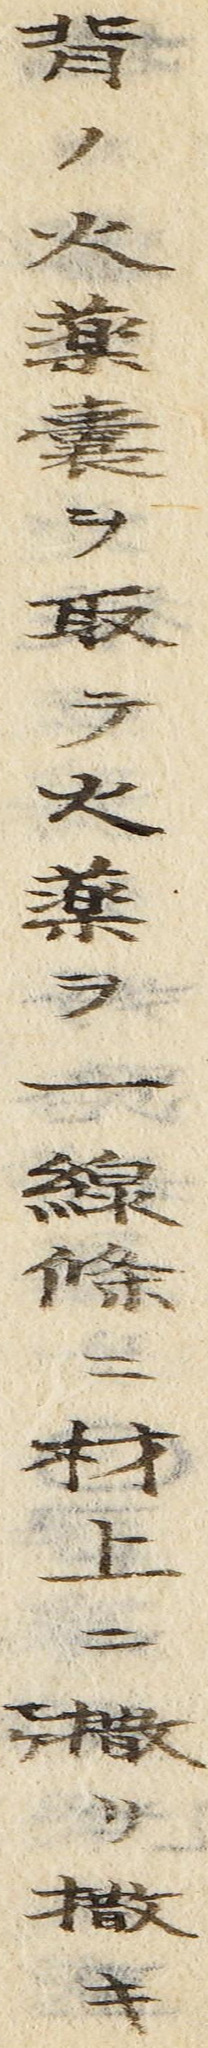背ノ火薬嚢ヲ取テ火薬ヲ一線条ニ材上ニ撒リ撒キ
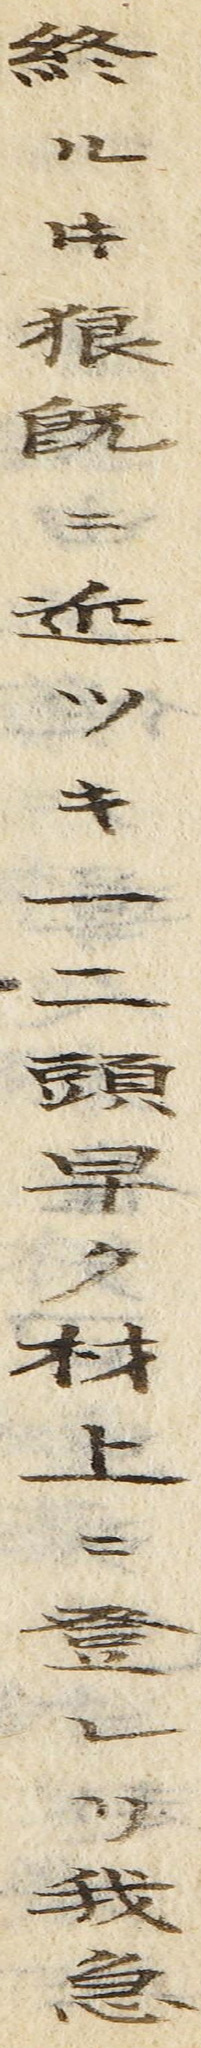終ルトキ狼既ニ近ツキ一二頭早ク材上ニ登レリ我急
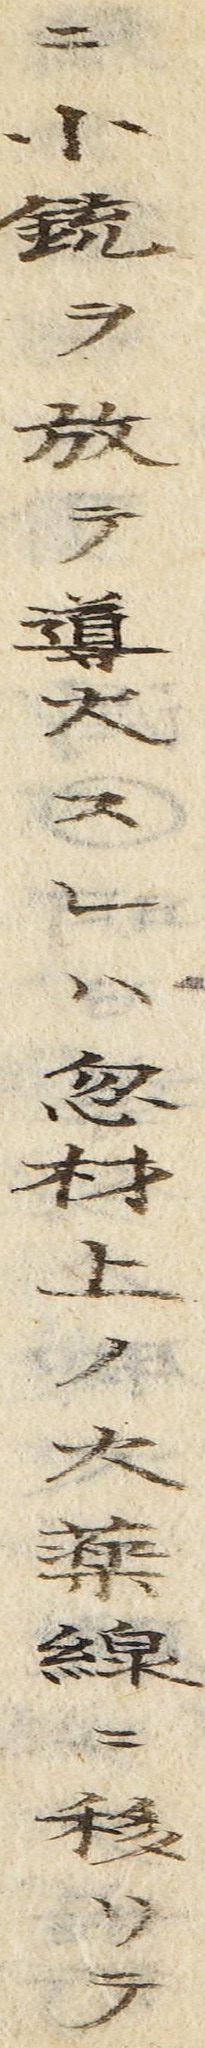ニ小銃ヲ放テ導火スレハ忽材上ノ火薬線ニ移リテ
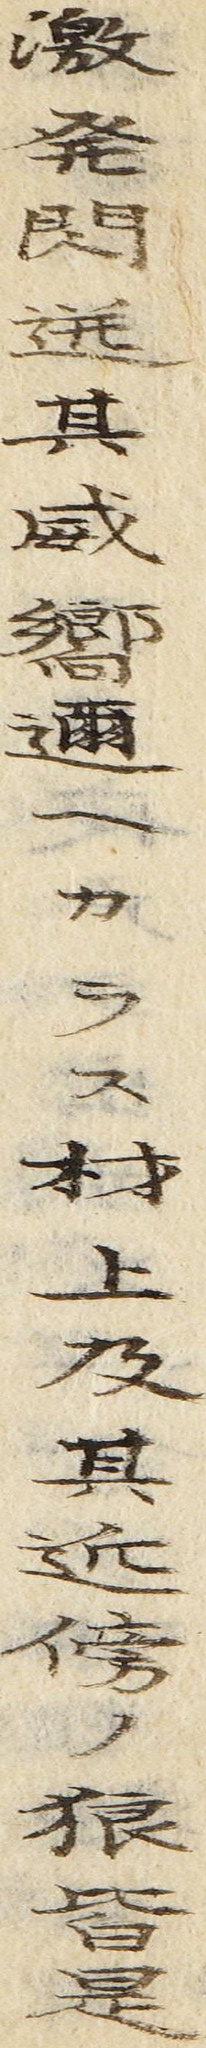激発閃迸其威嚮邇ヘカラス材上及其近傍ノ狼皆是
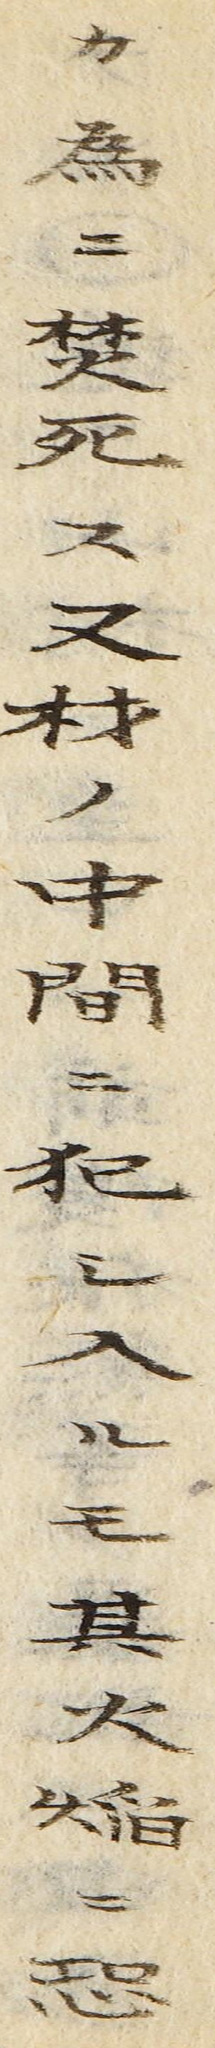カ為ニ焚死ス又材ノ中間ニ犯シ入ルモ其火焔ニ恐
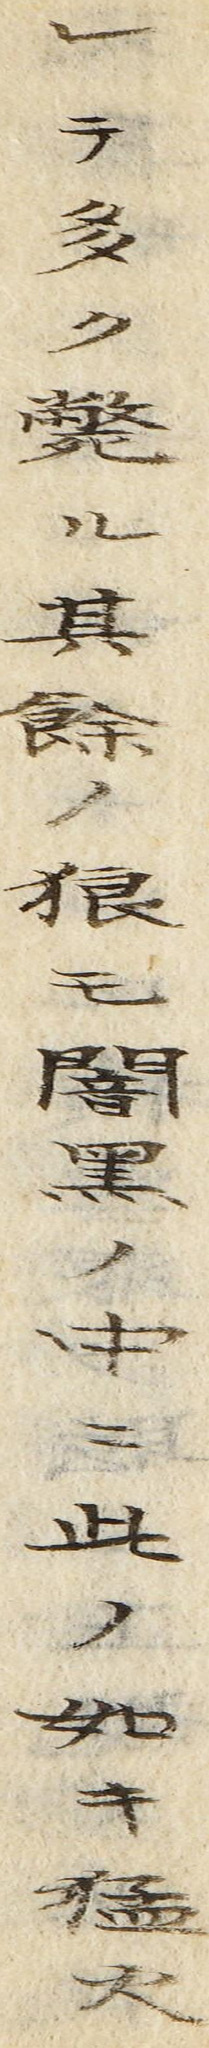レテ多ク斃ル其余ノ狼モ闇黒ノ中ニ此ノ如キ猛火
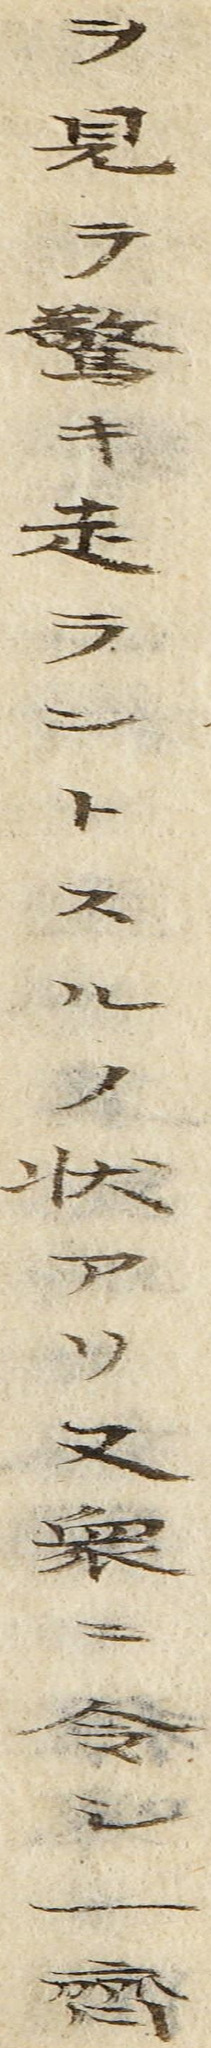ヲ見テ驚キ走ラントスルノ状アリ又衆ニ令シ一斉
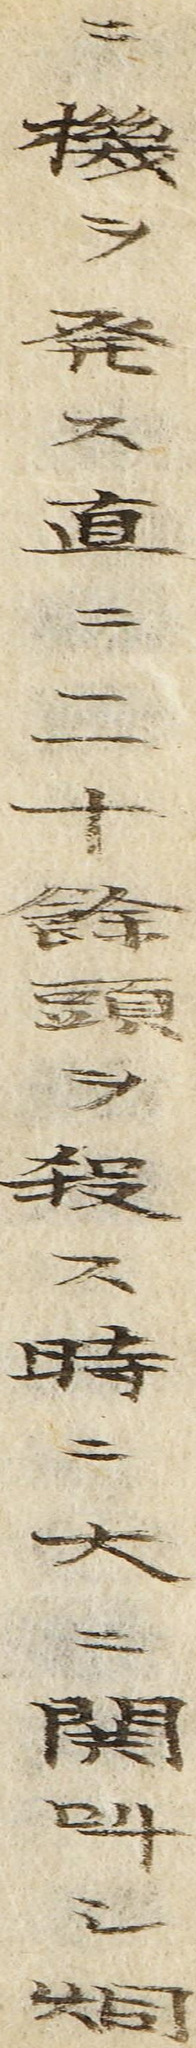ニ機ヲ発ス直ニ二十余頭ヲ殺ス時ニ大ニ鬨叫シ煙
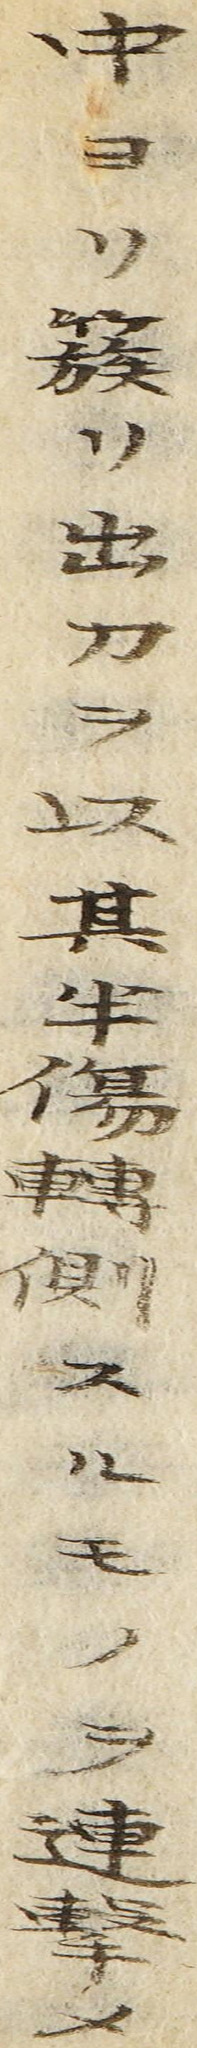中ヨリ簇リ出力ヲ以其半傷転側スルモノヲ連撃シテ

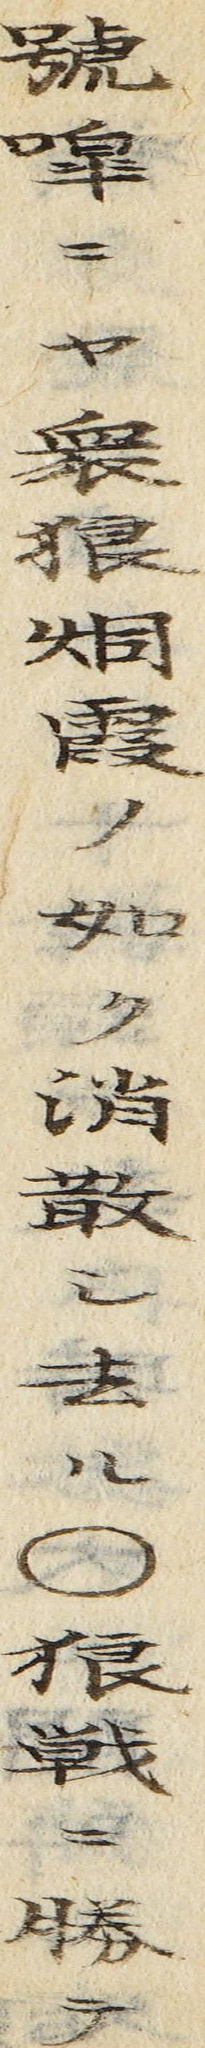号噑ニヤ衆狼煙霞ノ如ク消散シ去ル◯狼戦ニ勝テ
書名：漂流紀事
